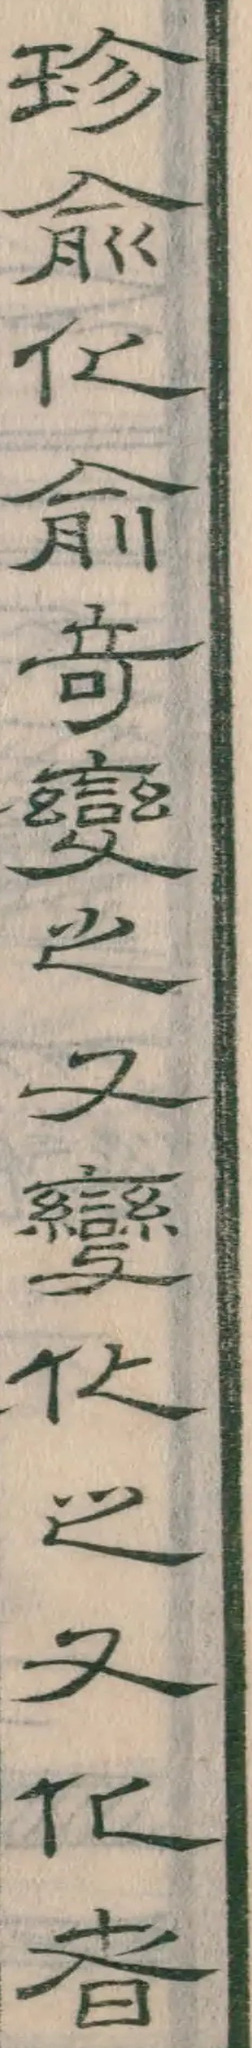珍兪化兪奇変之又変化之又化者
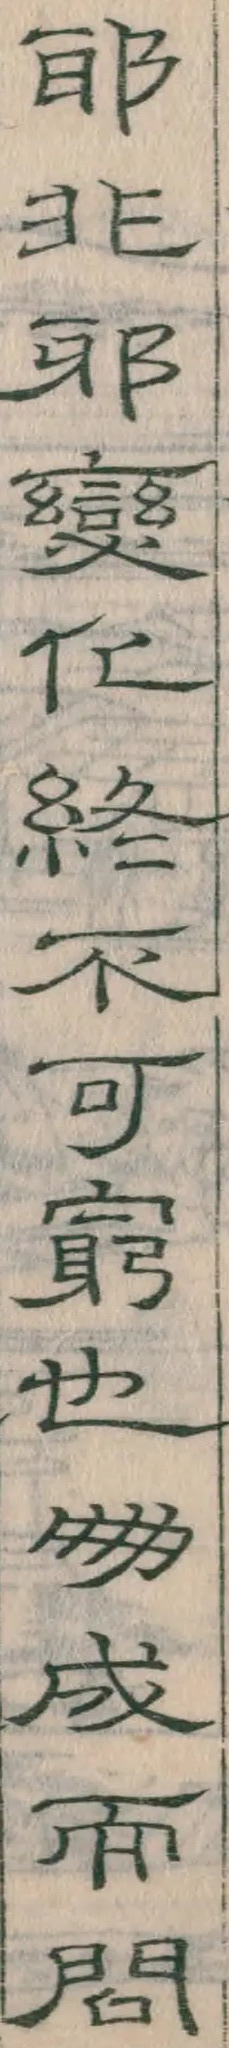耶非邪変化終不可窮也冊成而問
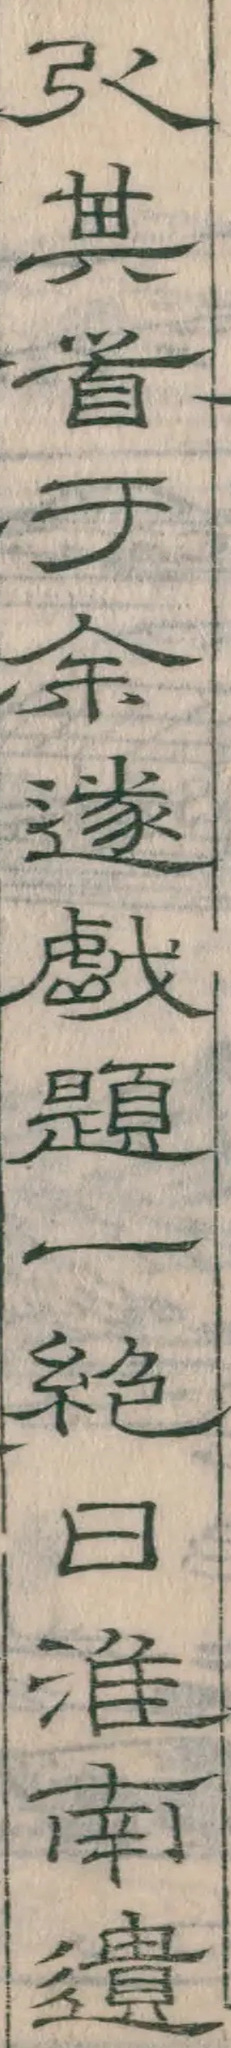弘其首于余遂戯題一絶曰淮南遺
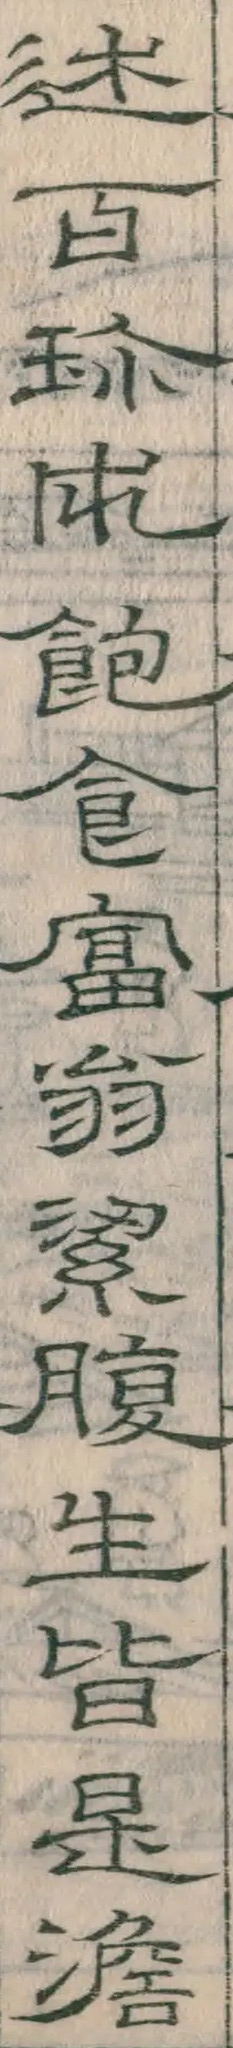述百珍成飽食富翁潔腹生皆是澹
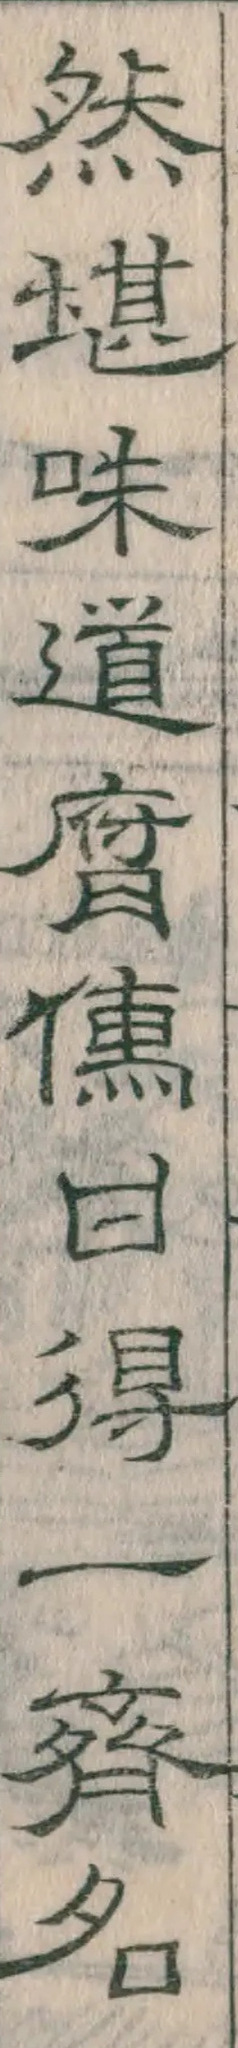然堪味道腐儒甘得一斉名
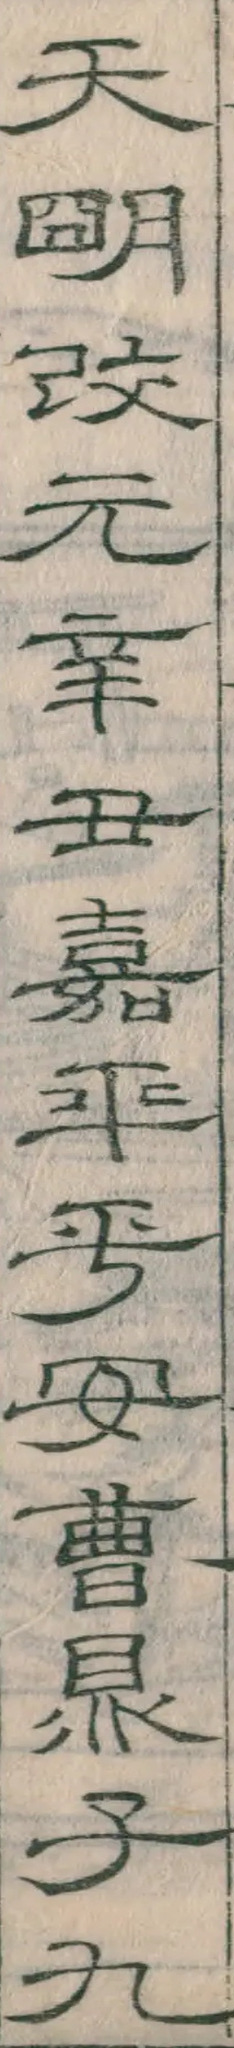天明改元辛丑嘉年平安曹鼎子九
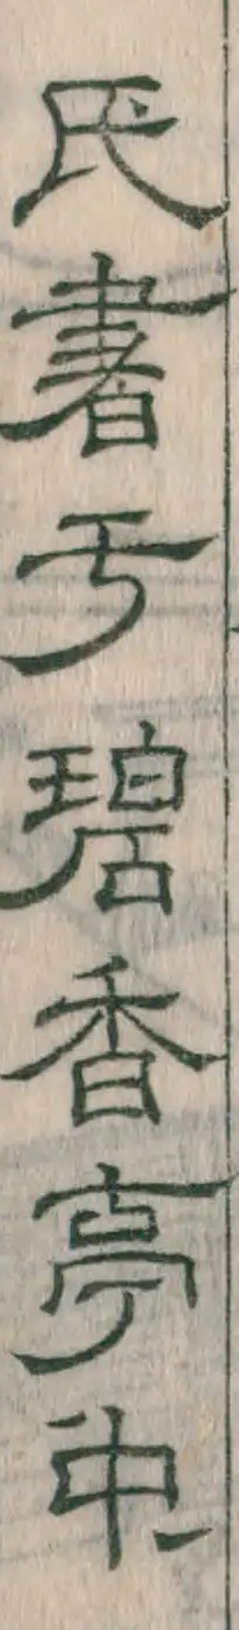氏書于碧香亭中

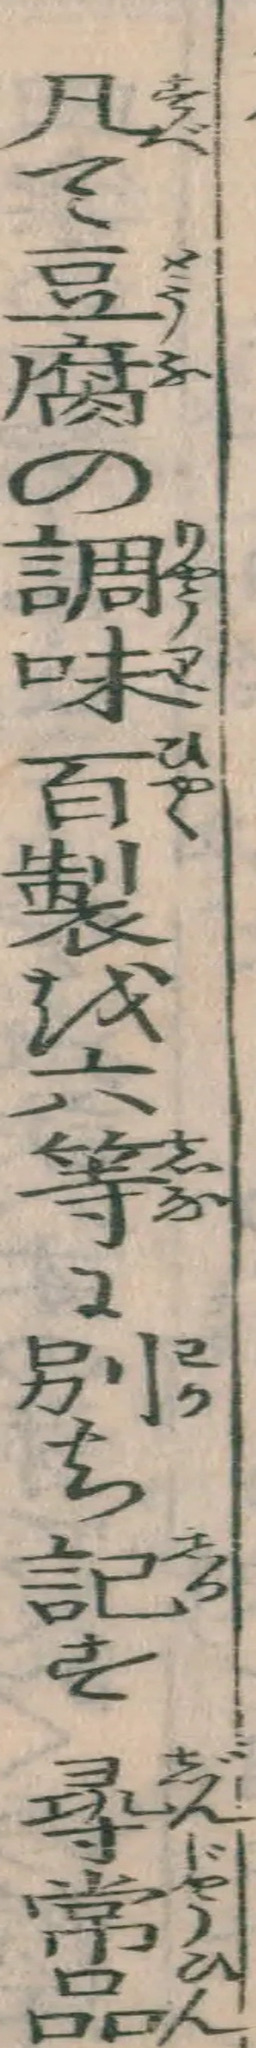一凡て豆腐の調味百製を六等に別ち記す尋常品
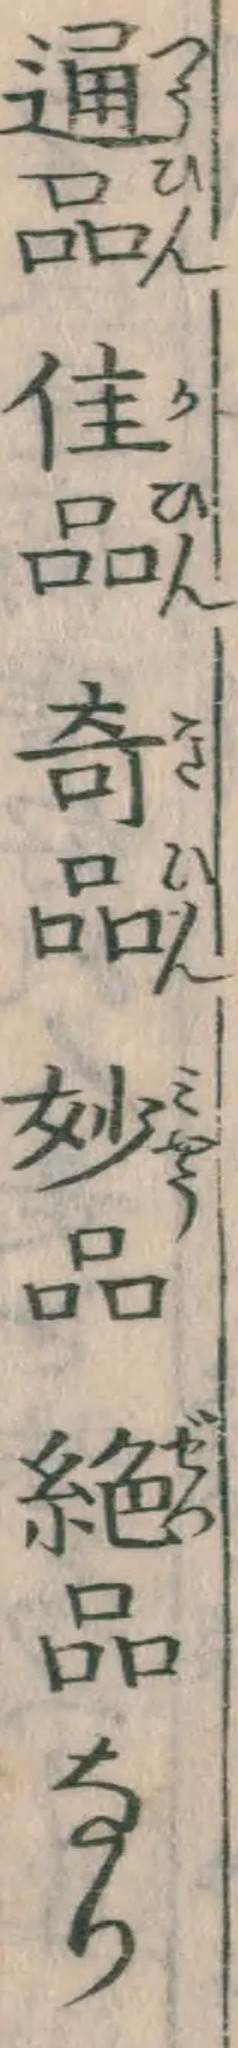通品佳品奇品妙品絶品なり
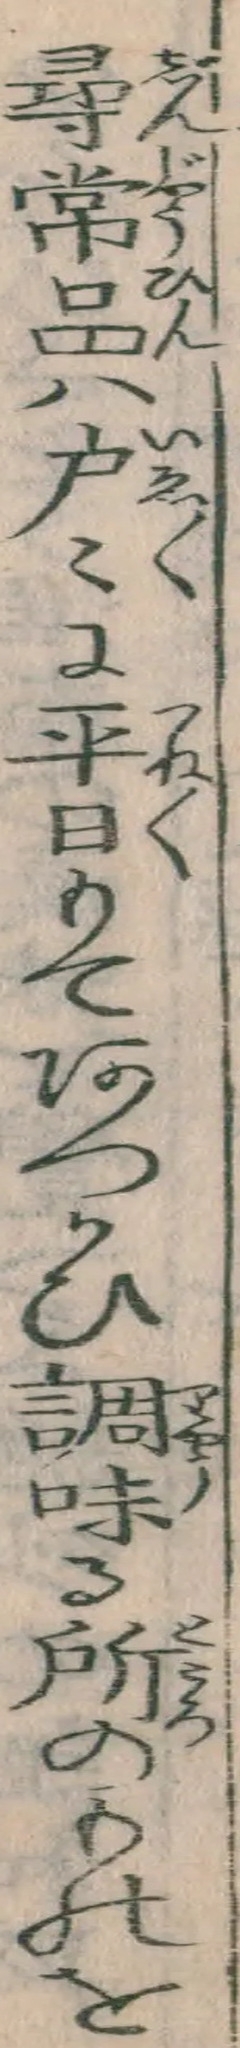一尋常品は戸々に平日もてあつかひ調味る所のものを
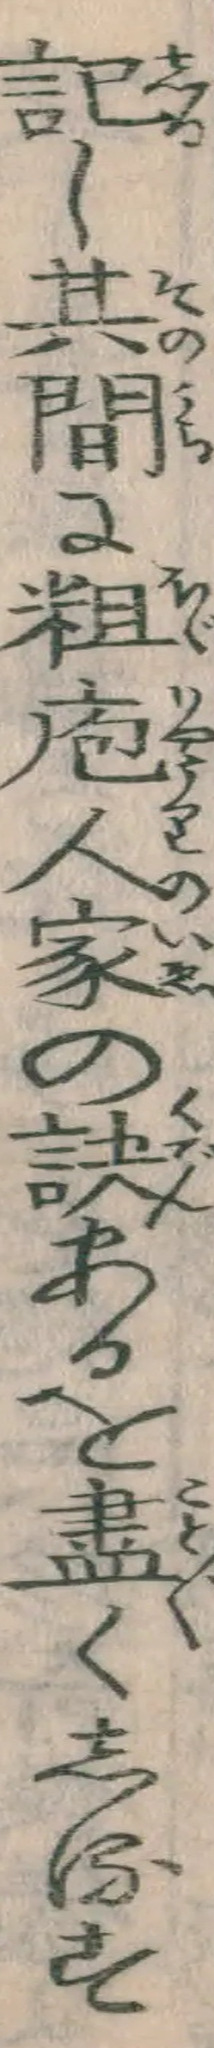記し其間に粗庖人家の訣あるを盡くしるす
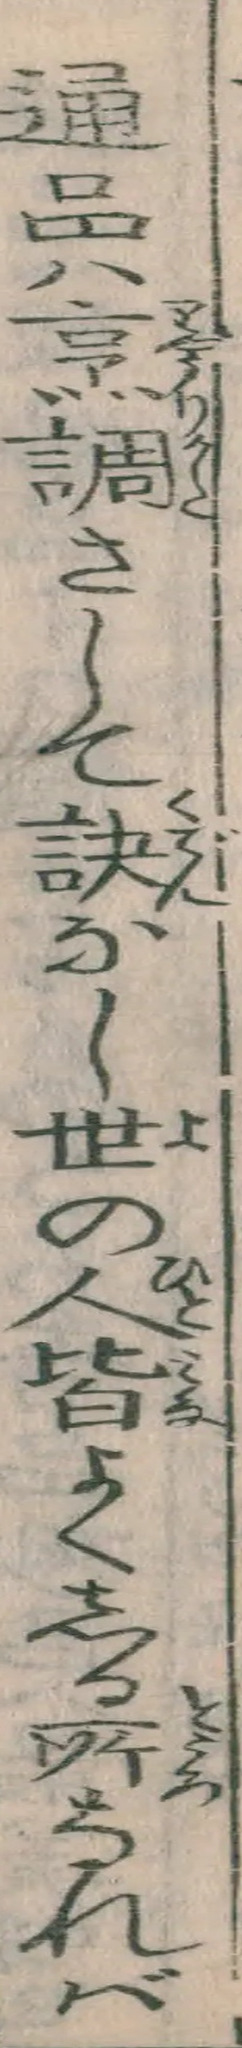一通品は烹調さして訣なし世の人皆よくしる所なれば
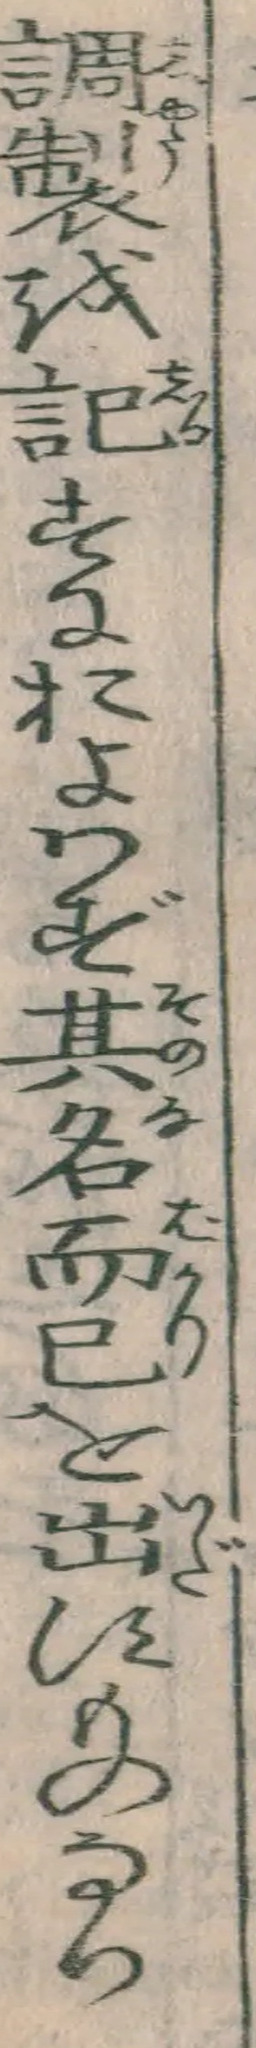調製を記すにおよはず其名而已を出すものなり
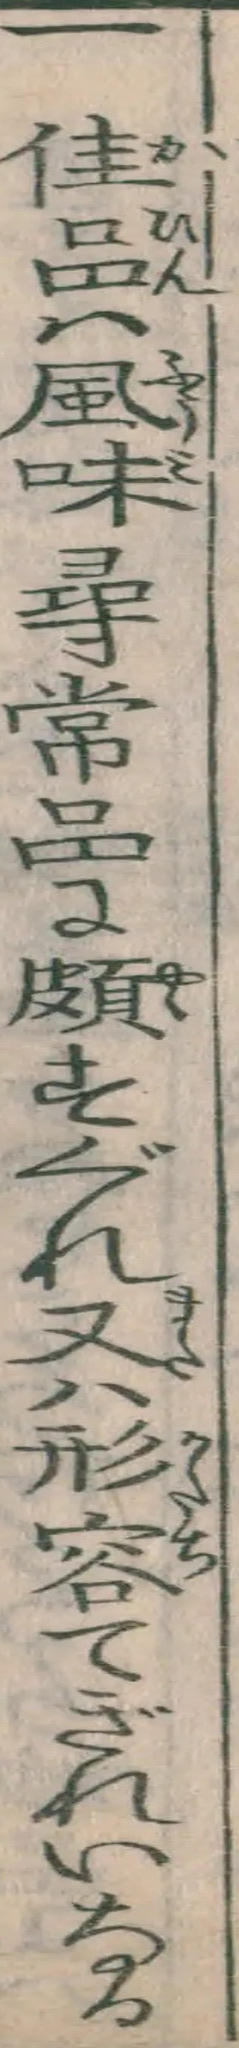一佳品は風味尋常品に頗すぐれ又は形容てぎれいなる
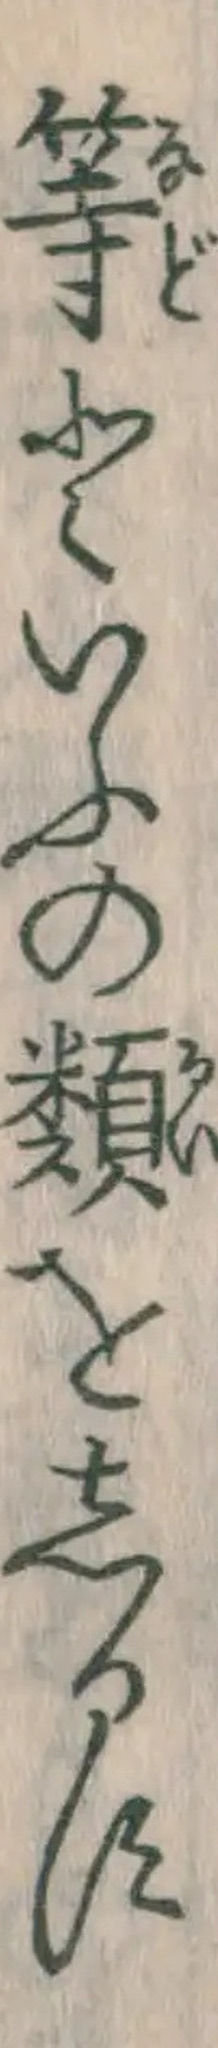等といふの類をしるす
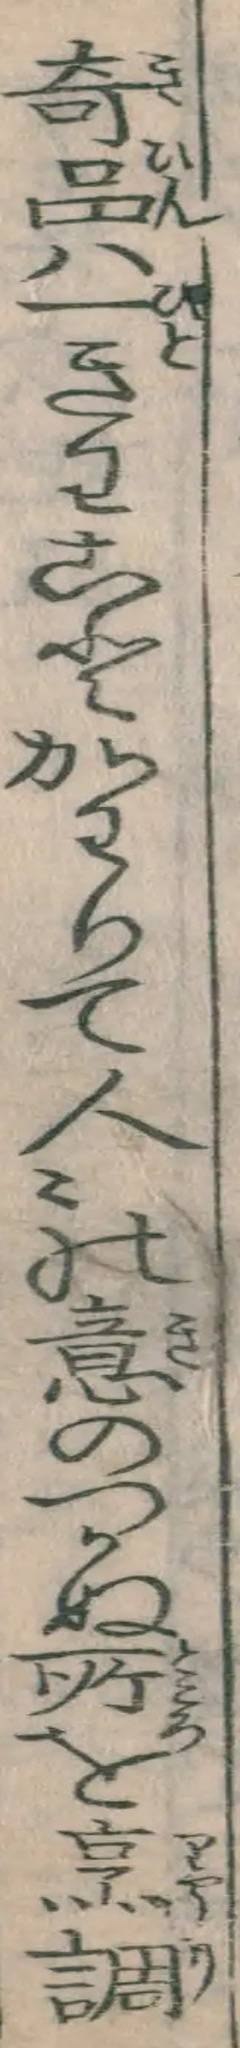一奇品は一きわことかわりて人々の意のつかぬ所を烹調
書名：豆腐百珍. [正編]
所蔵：国立国会図書館 National Diet Library, JAPAN
